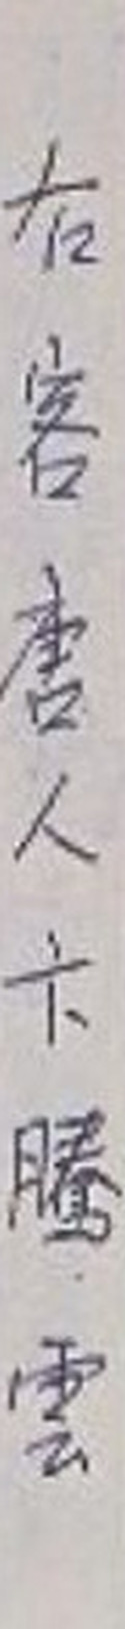右客唐人卞騰雲
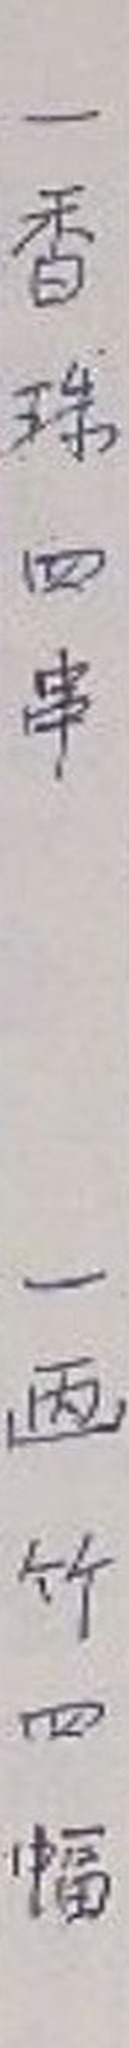一香珠四串一画竹四幅
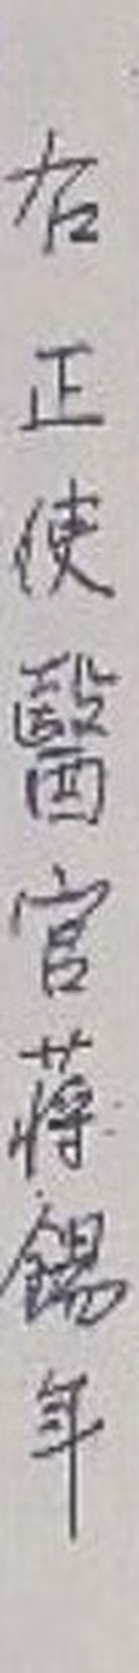右正使医官䉃錫年
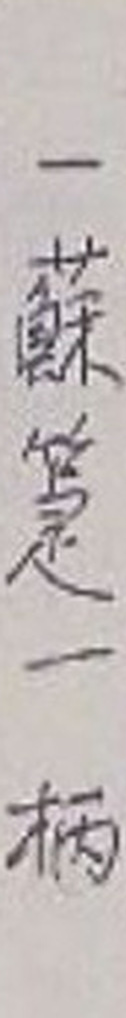一蘇扇一柄一聯対一付
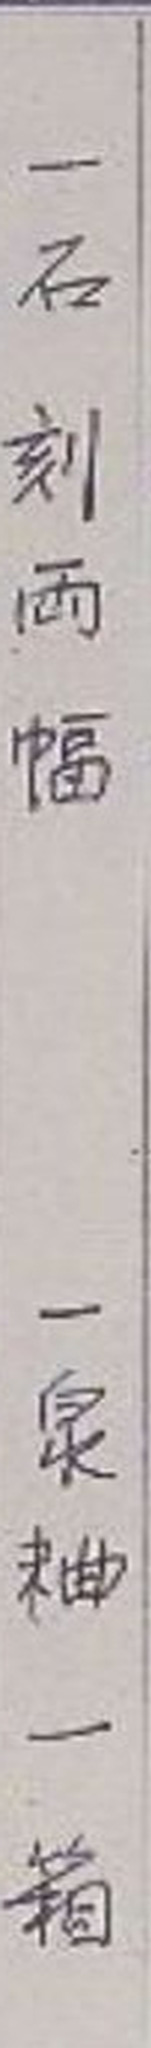一石刻両幅一泉粬一箱
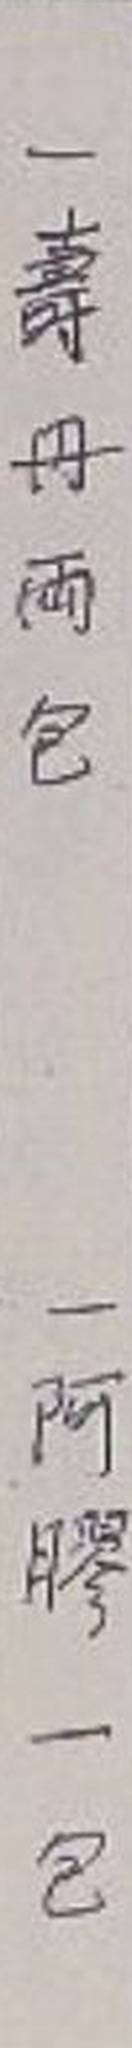一寿丹両包一阿膠一包

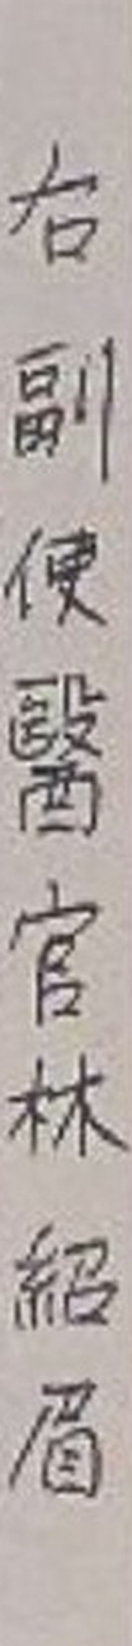右副使医官林紹眉
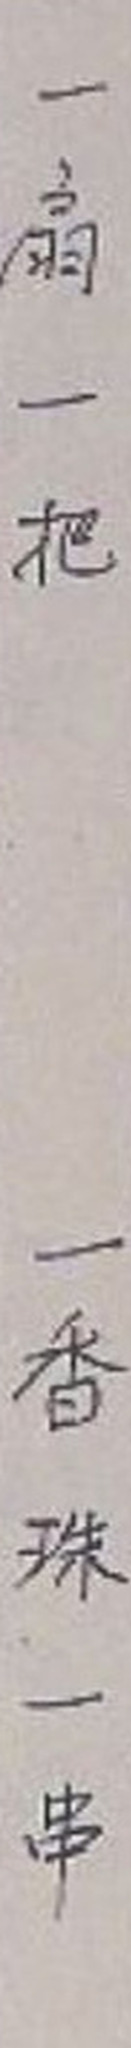一扇一把一香珠一串
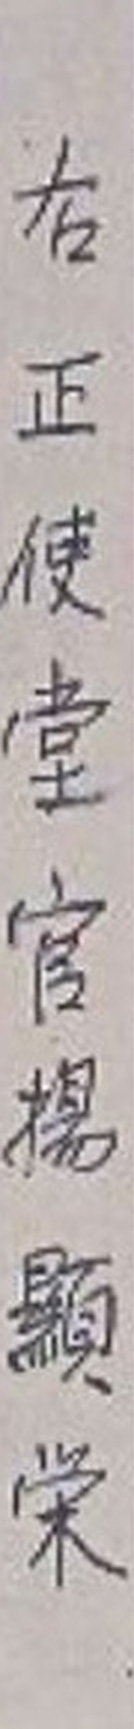右正使堂官楊顕栄
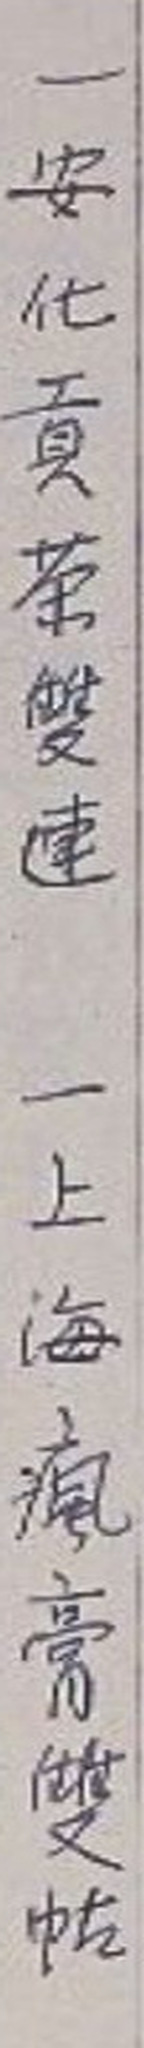一安化貢茶雙連一上海瘋膏雙帖
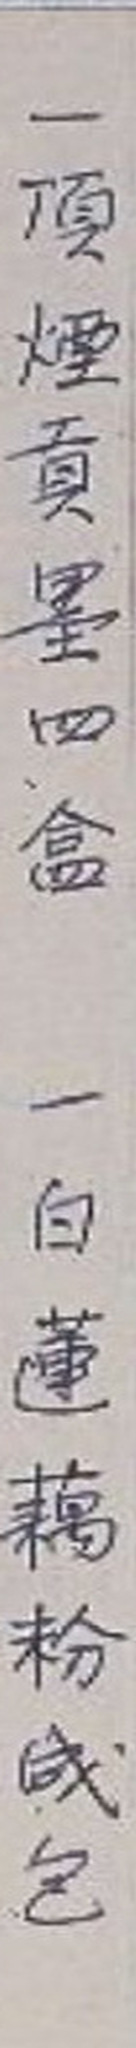一頂煙貢墨四盒一白蓮藕粉成包
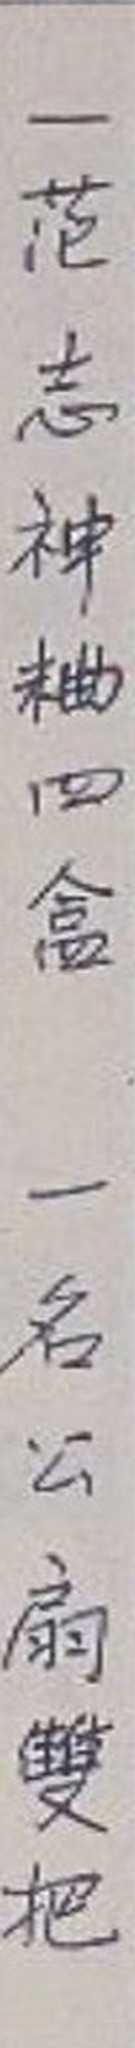一范志神粬四盒一名公扇雙把
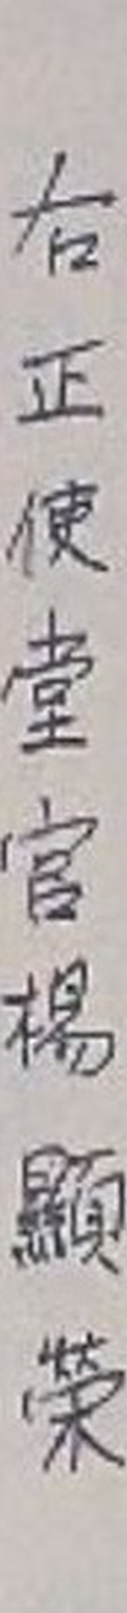右正使堂官楊顕栄
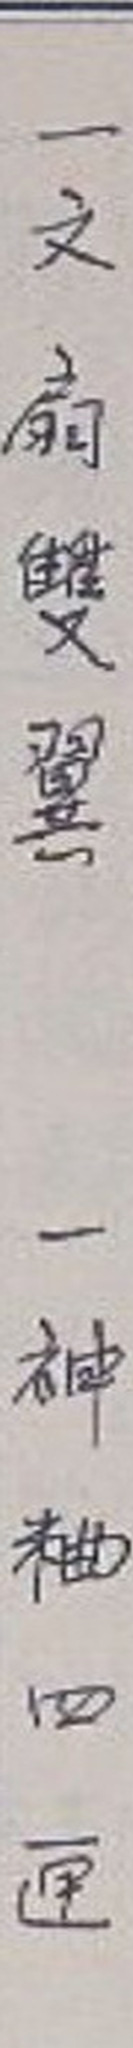一文扇雙翼一神粬四匣
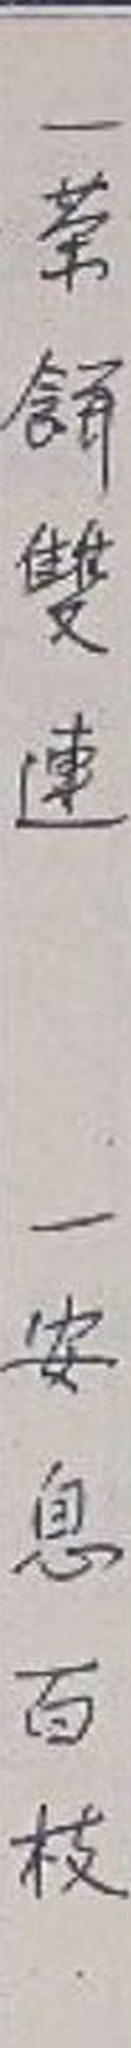一茶餅雙連一安息百枝
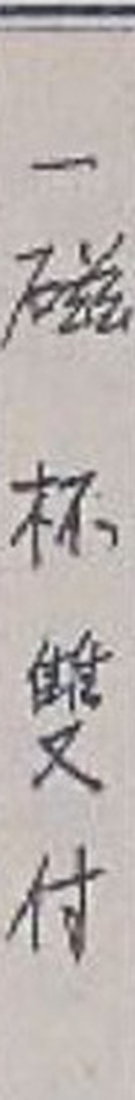一磁杯雙対
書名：支那冊封使来琉諸記 下巻
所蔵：University of the Ryukyus Library
